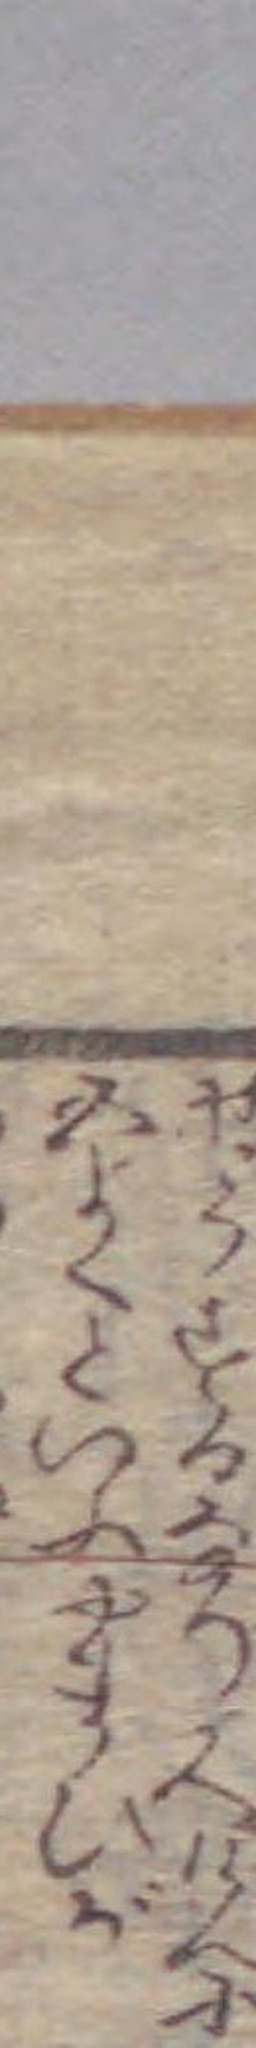五よくといふやまひが
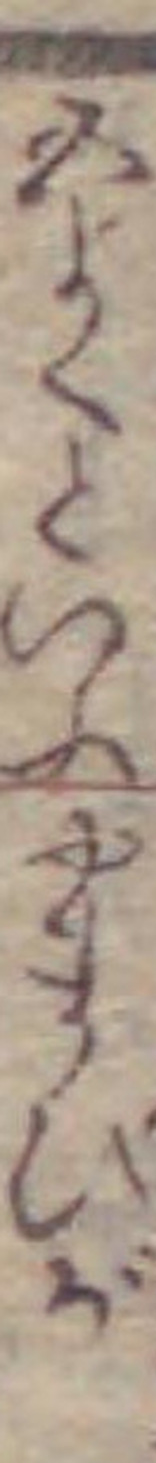五よくといふやまひが
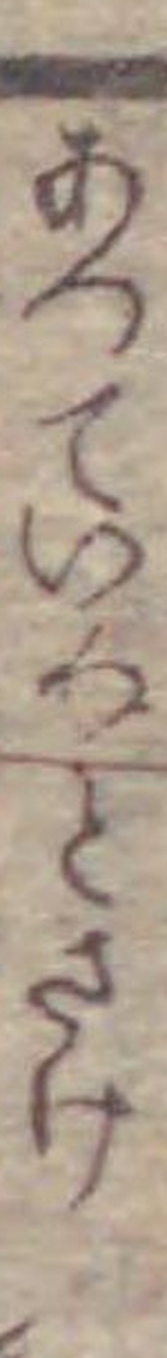あつていろとさけ
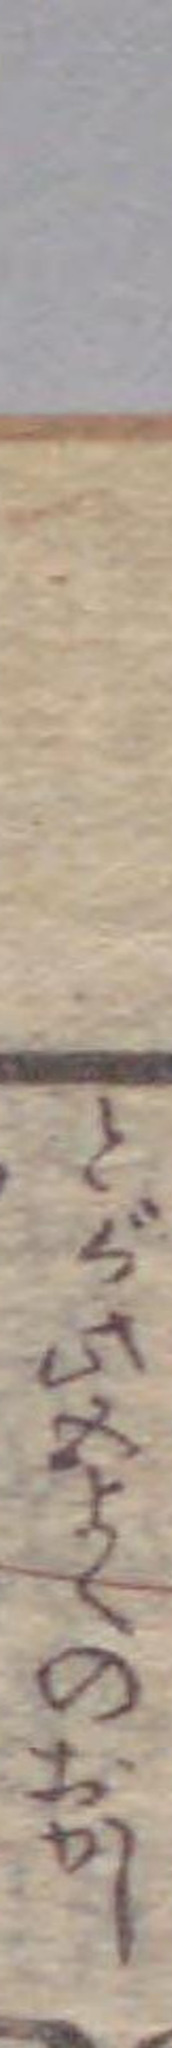とが此五よくのおかし
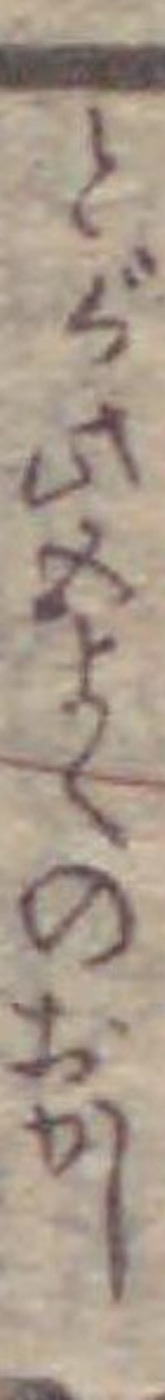とが此五よくのおかし
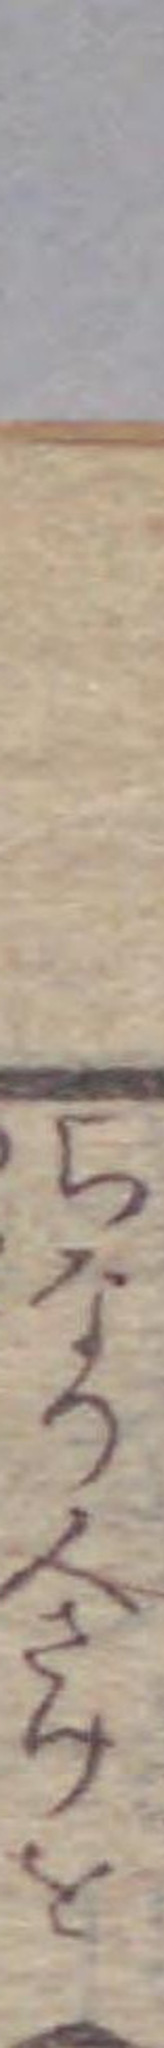らなり人さけを
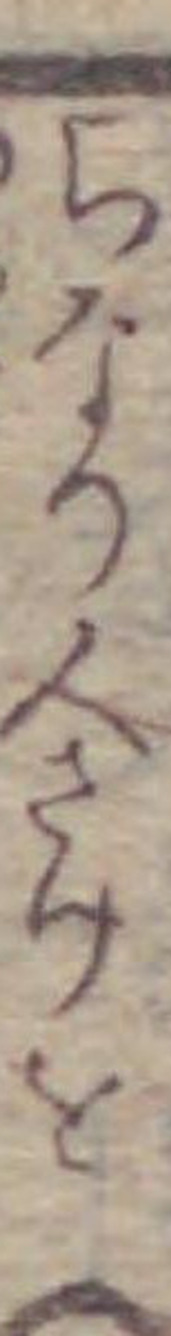らなり人さけを
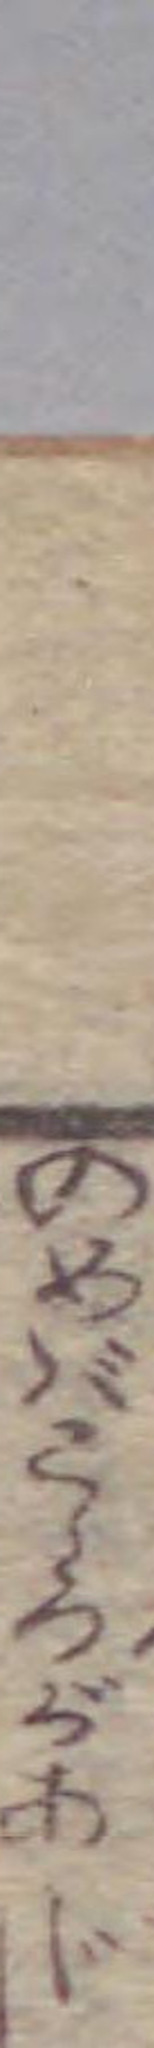のめばこゝろがあじ
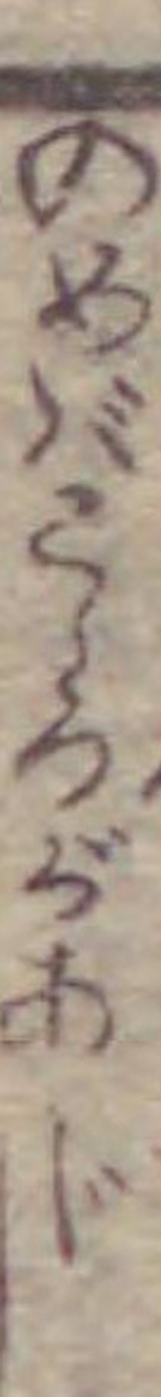のめばこゝろがあじ
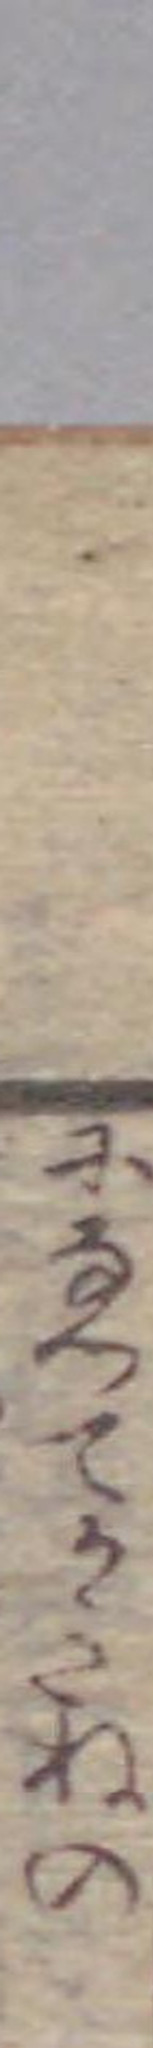になつてかきねの
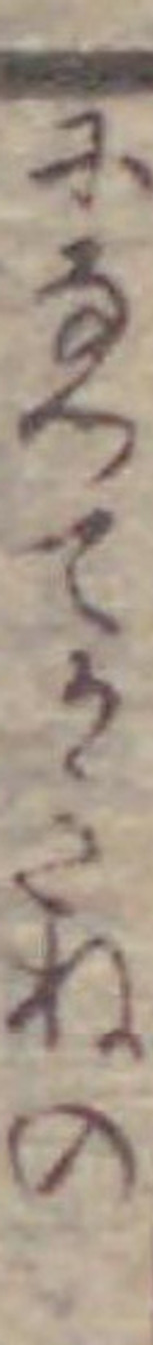になつてかきねの
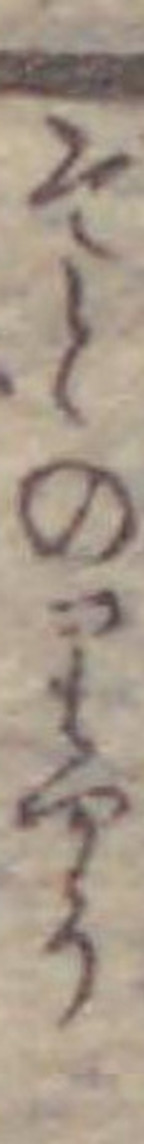そとのりやう
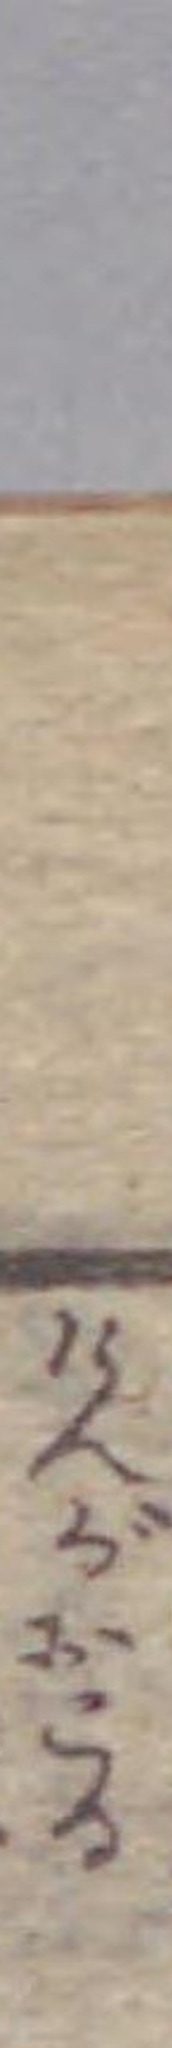けんがおこる
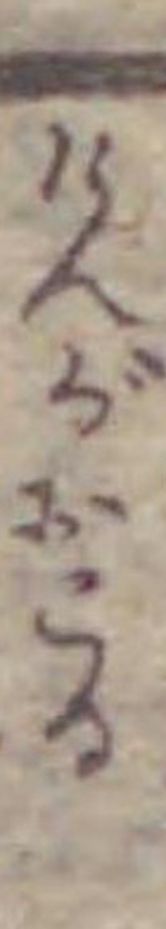けんがおこる
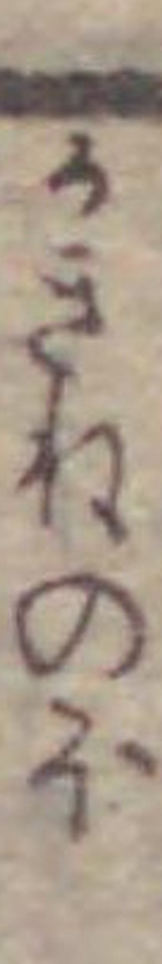かきねのほ
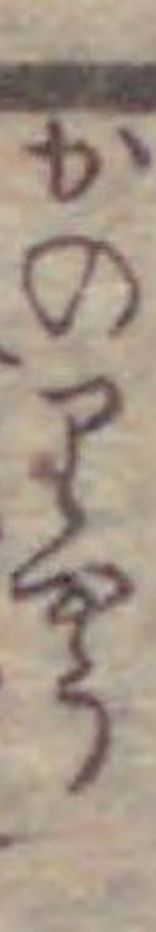かのりやう
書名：鼻下長生薬 : 3巻
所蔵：国立国会図書館 National Diet Library, JAPAN
